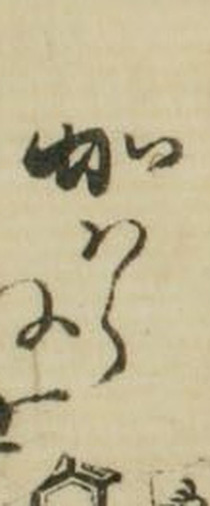かはら
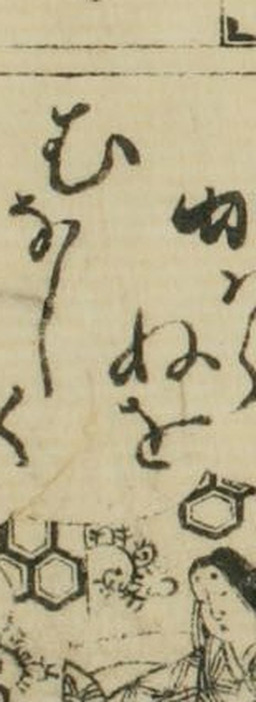むなしく
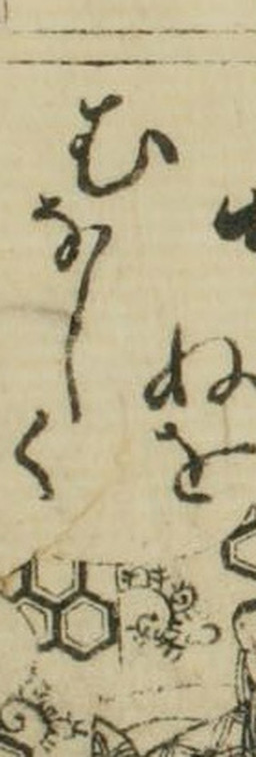むなしく
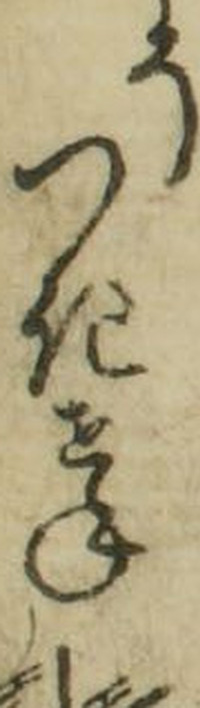つきせね

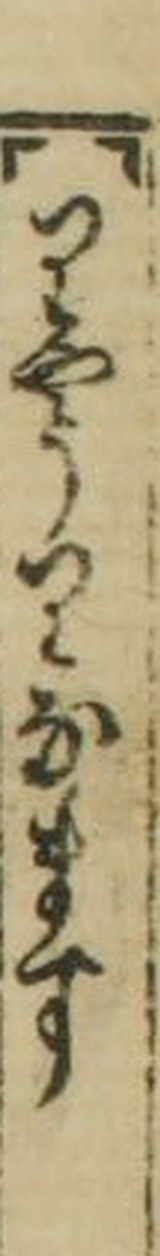りやうりなます
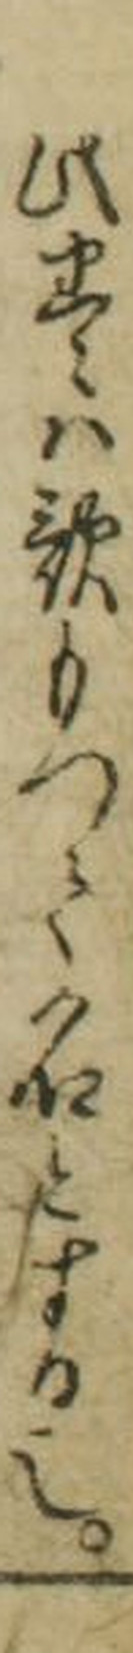此巻は歌もつて名とする也。
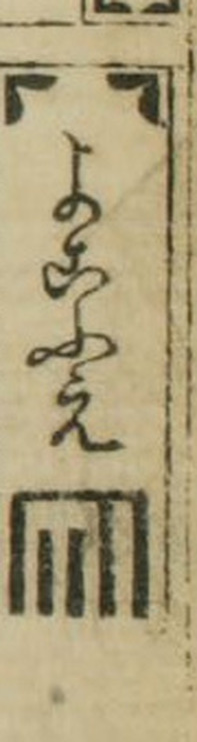よこふえ
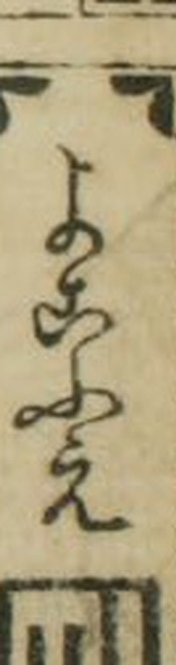よこふえ
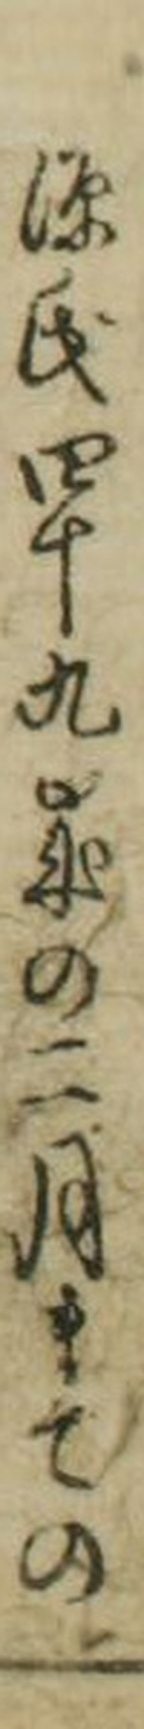源氏四十九歳の二月まての
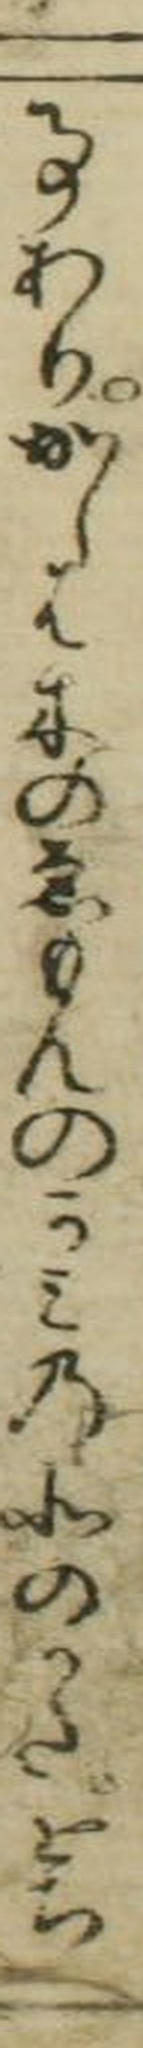事あり。かしは木のゑもんのかみの北のかた。をち
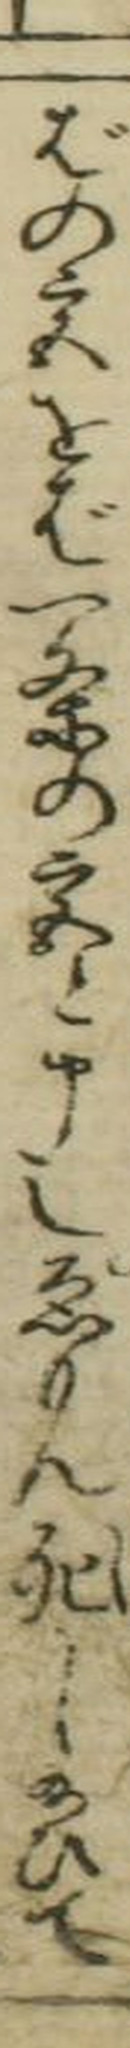ばの宮をば一条の宮と申也。ゑもん死し給ひて
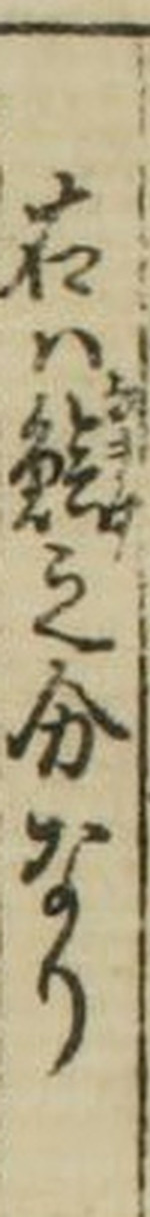右は鱠之分なり
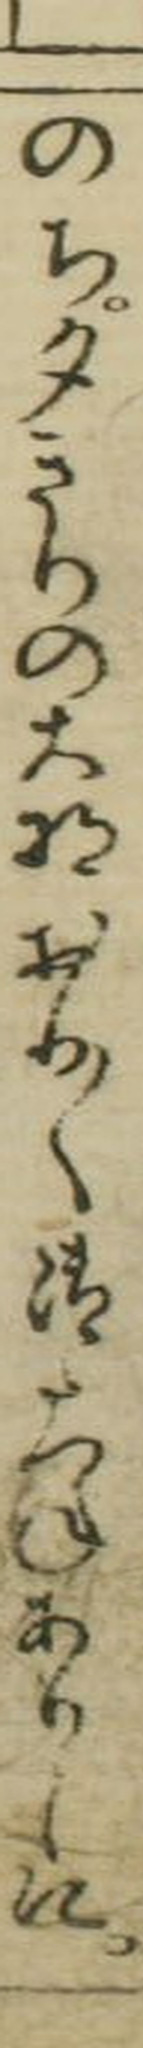のち。夕きりの大将おり〳〵御たつねありしに。
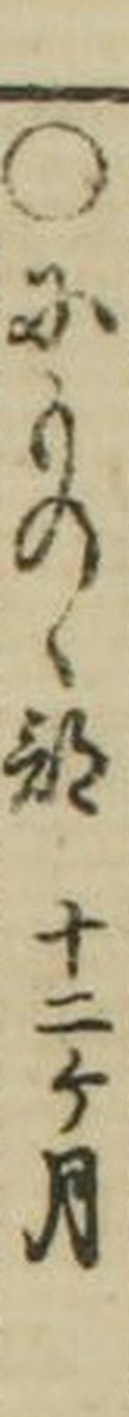◯にものゝ部十二ヶ月
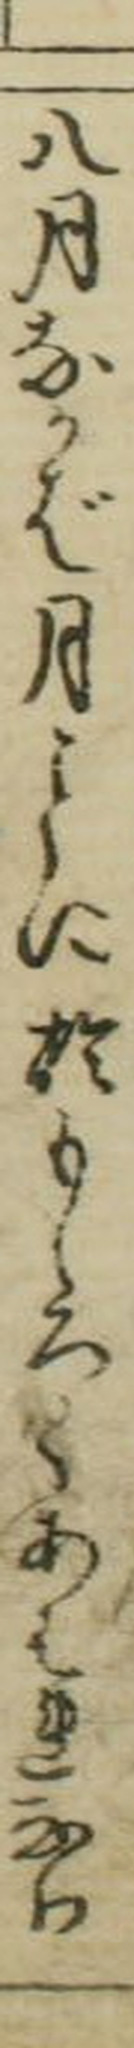八月なかば月ことにおもしろくあはれなり
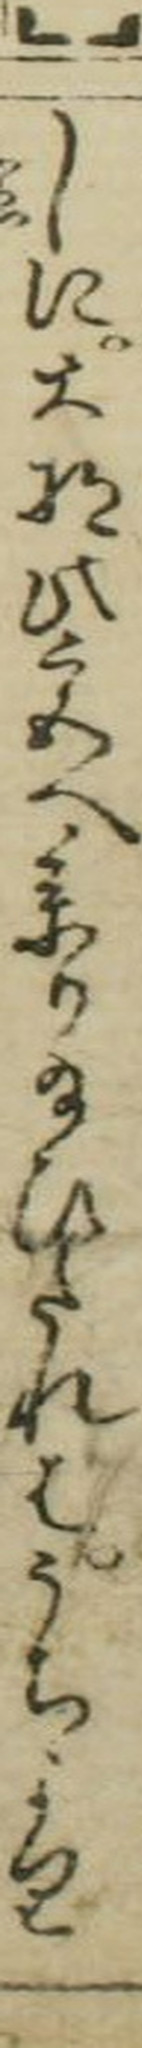しに。大将此宮へ参り給ひたれは。うちより
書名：女源氏教訓鑑
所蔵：東京学芸大学附属図書館
